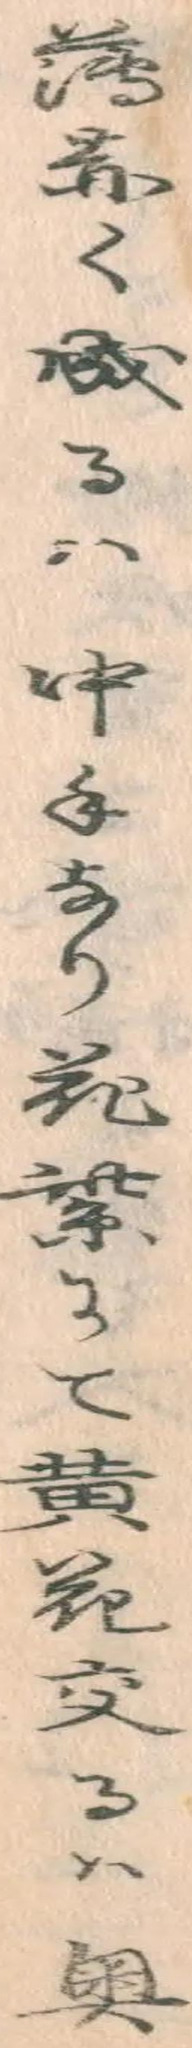薄赤く成るは中手なり花紫にて黄花交るは奥
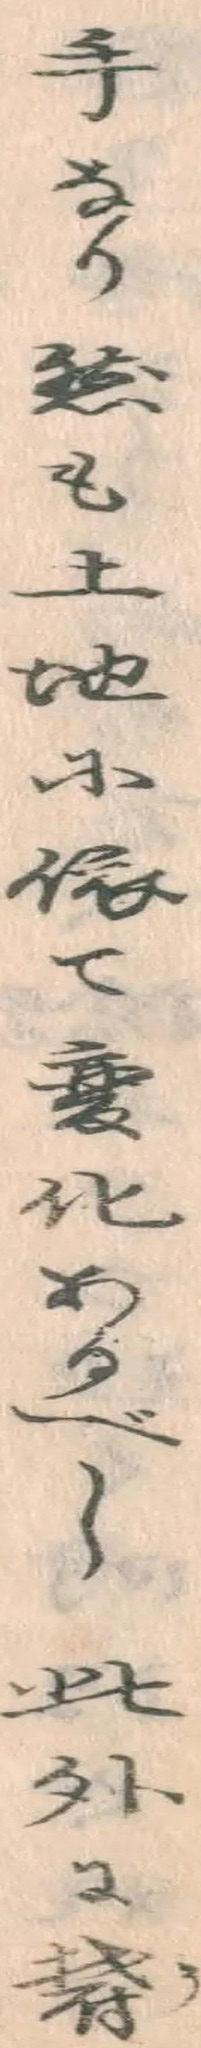手なり然も土地に依て変化あるべし此外に鬱
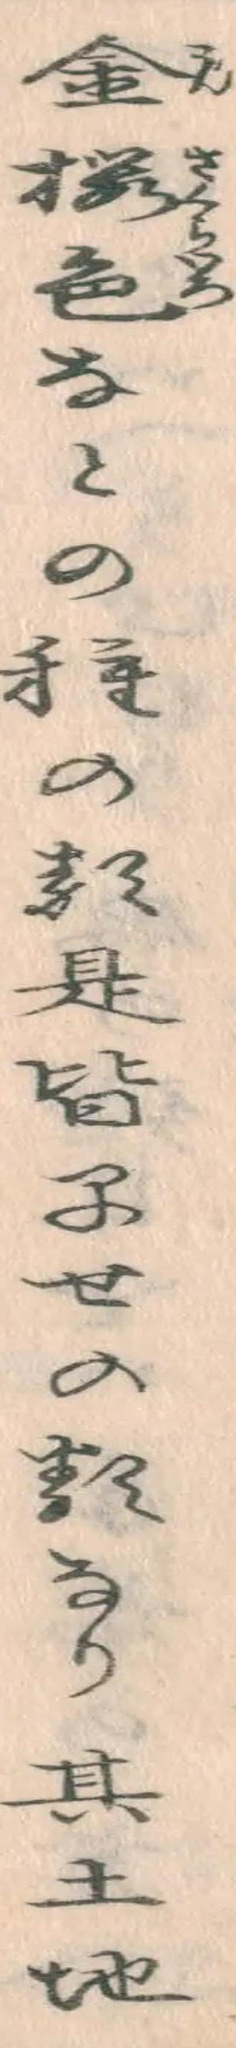金桜色なとの種の類是皆早せの類なり其土地
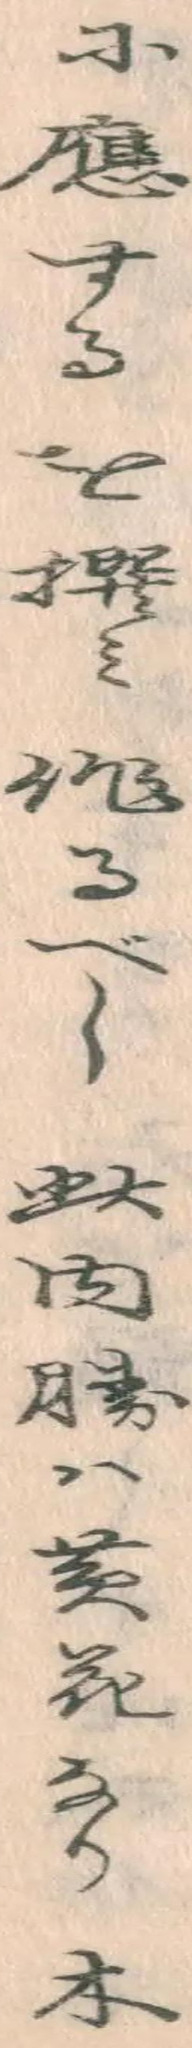に応するを撰み作るべし此内勝は黄花なり木
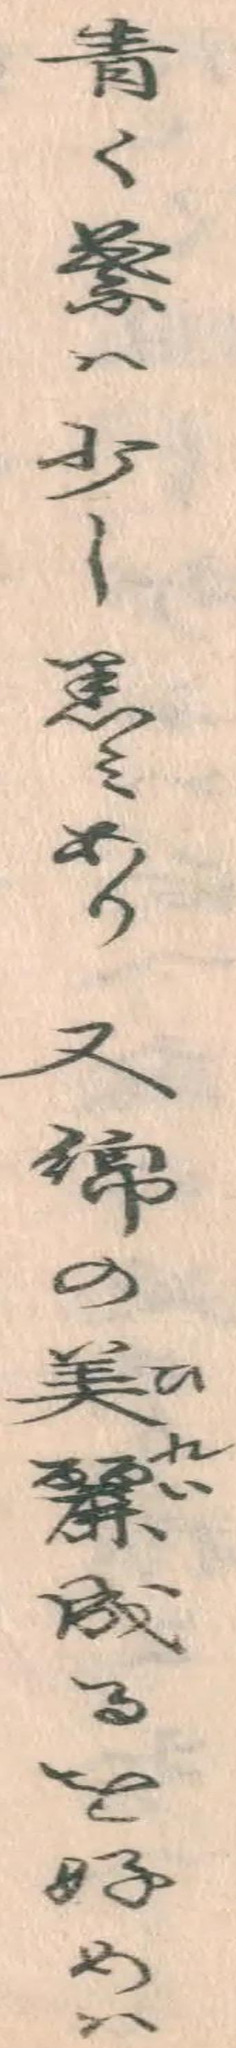青く葉は少し黒みあり又綿の美麗成るを好めは
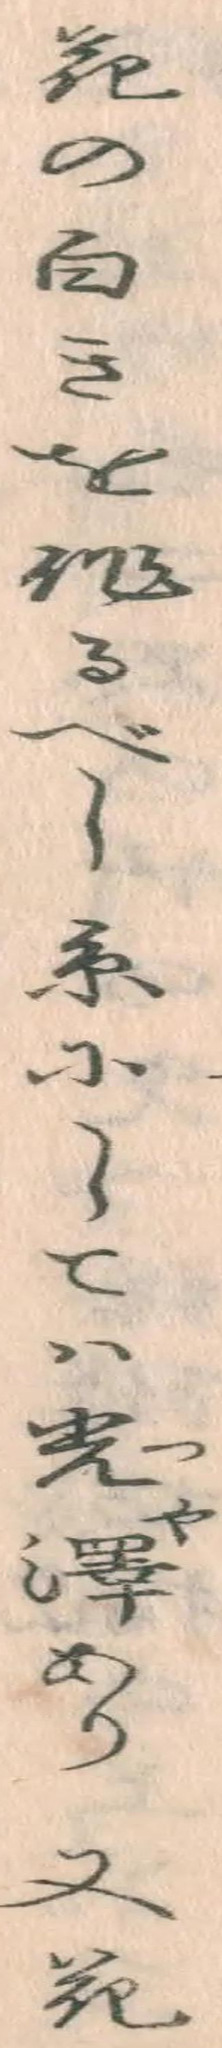花の白きを作るべし糸にしては光沢あり又花
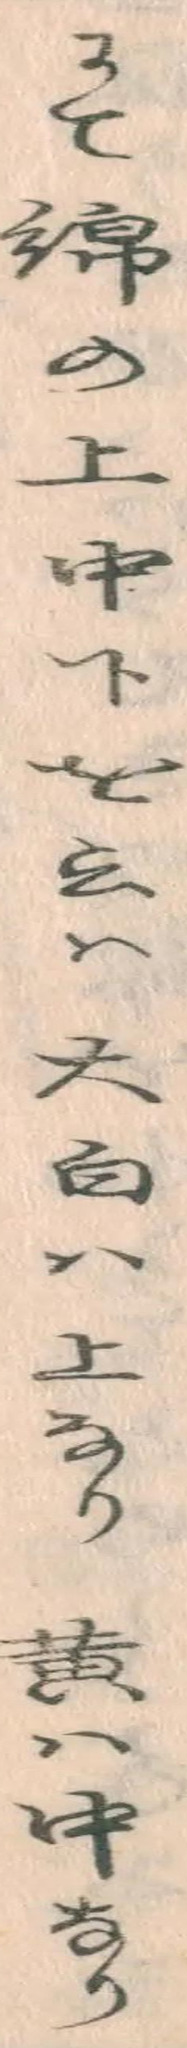にて綿の上中下を云は大白は上なり黄は中なり
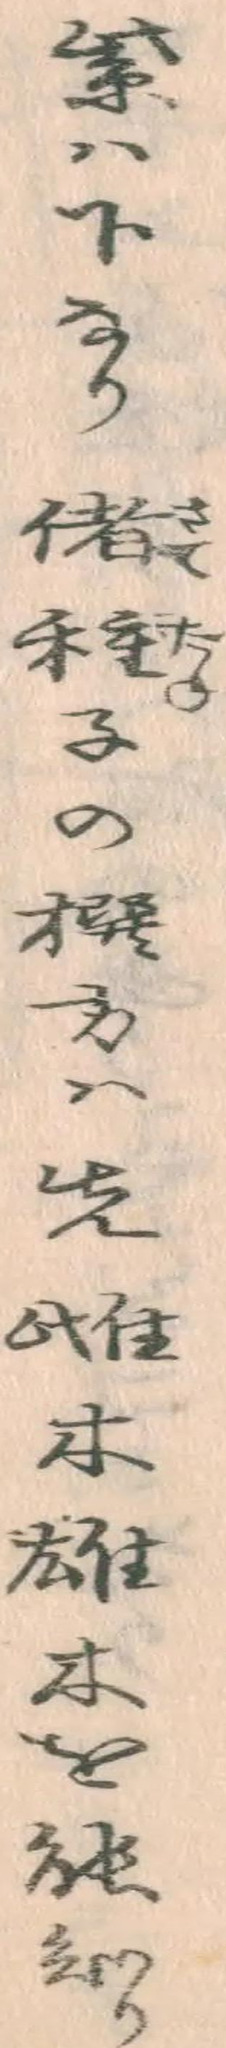紫は下なり偖種子の撰方は先雌木雄木を能知り
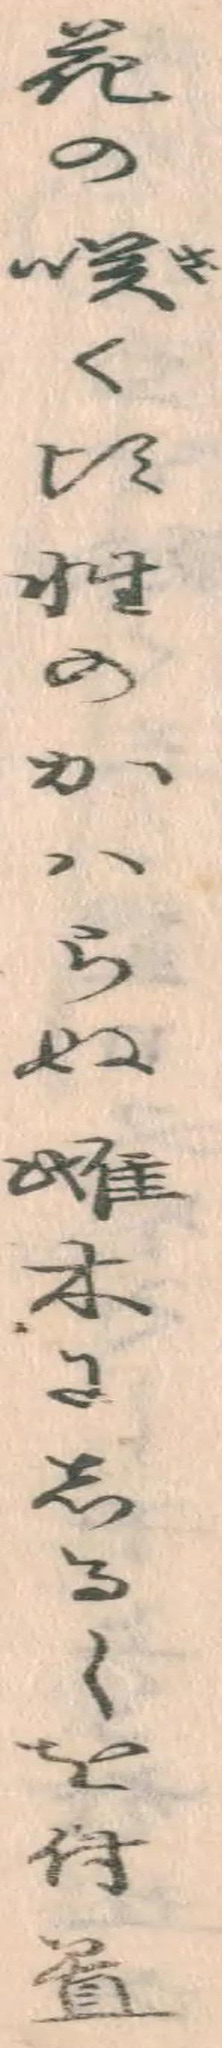花の咲く頃性のかはらぬ雌木にしるしを付置
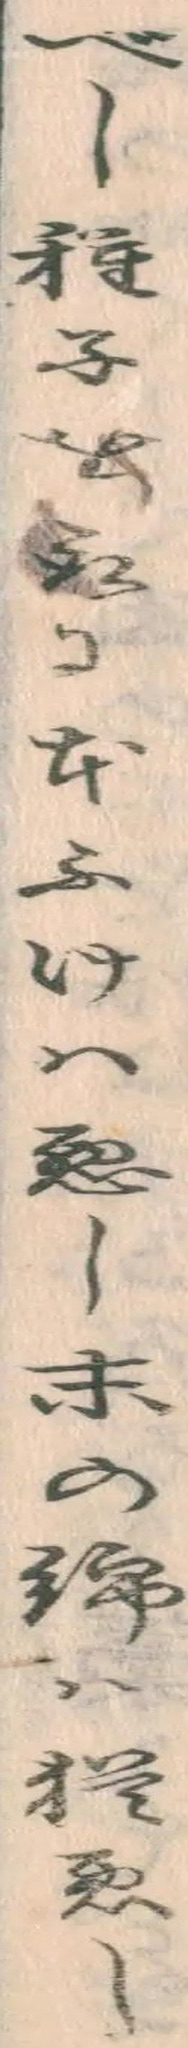べし種子を取に本ふけは悪し末の綿は猶悪し
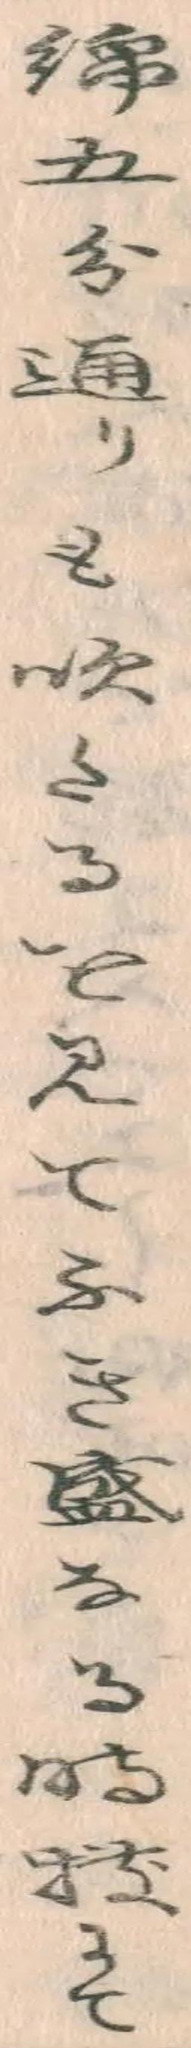綿五分通りも吹たるを見てふき盛なる時枝にて
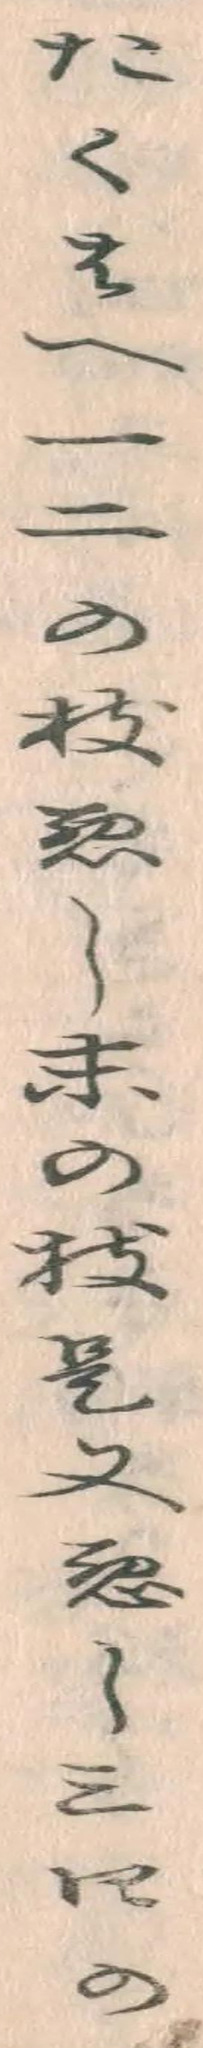たくはえ一二の枝悪し末の枝是又悪し三四の
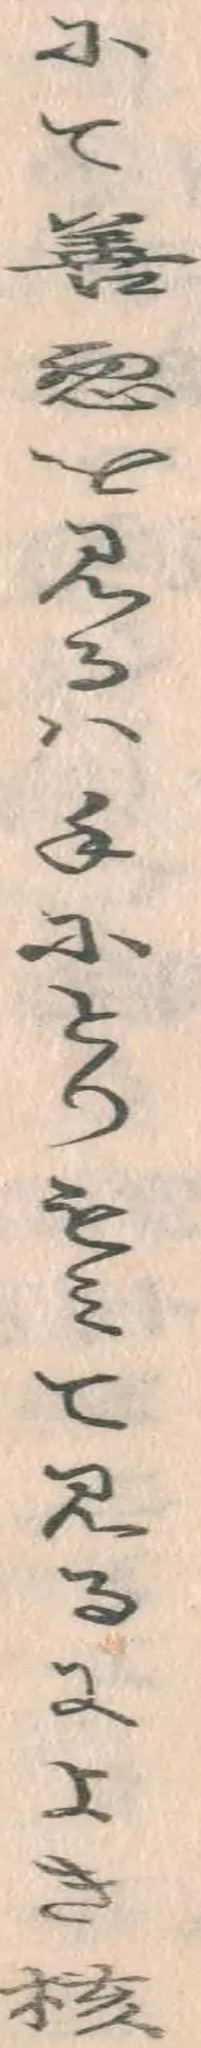にて善悪を見るは手にとりもみて見るによき核
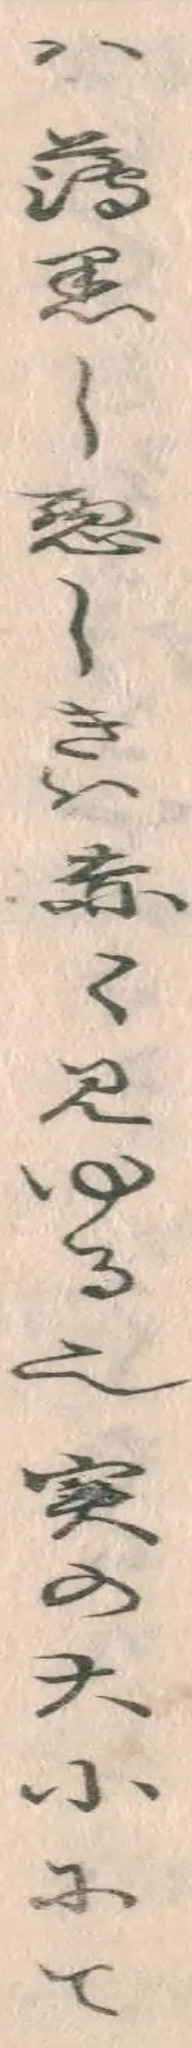は薄黒し悪しきは赤く見ゆる也実の大小にて
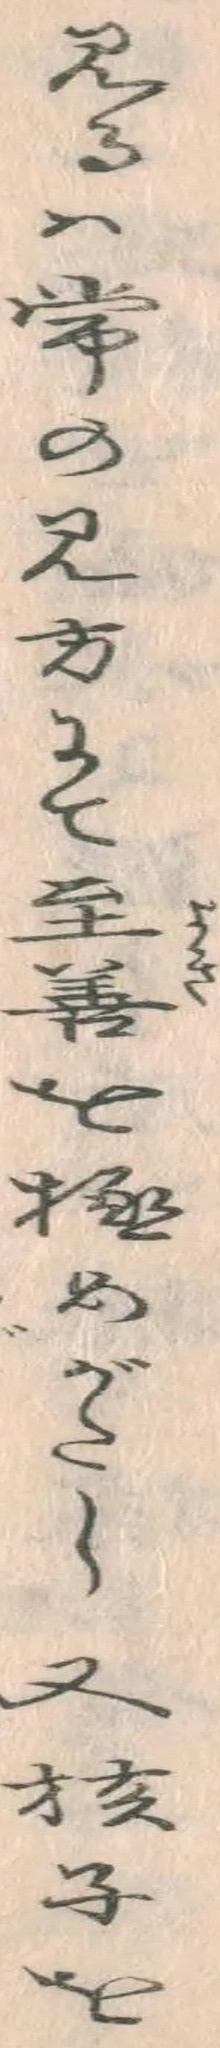見るは常の見方にて至善を極めがたし又核子を
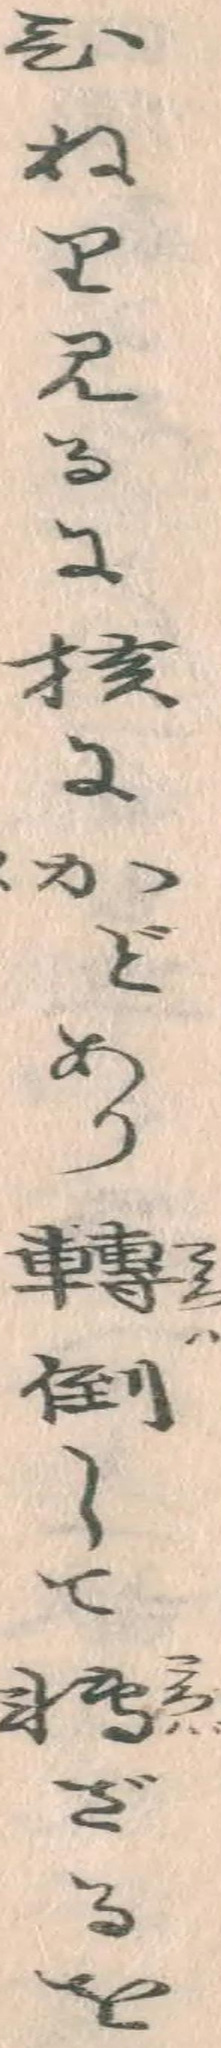ひねり見るに核にかどあり転倒して転ざるを
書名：機織彙編 5巻. [1]
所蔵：国立国会図書館 National Diet Library, JAPAN
